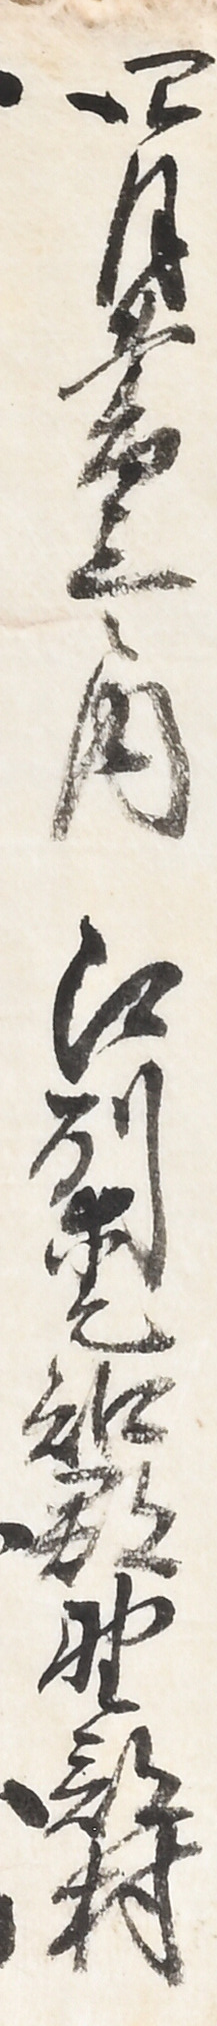四月書上之内江州愛知郡野部村
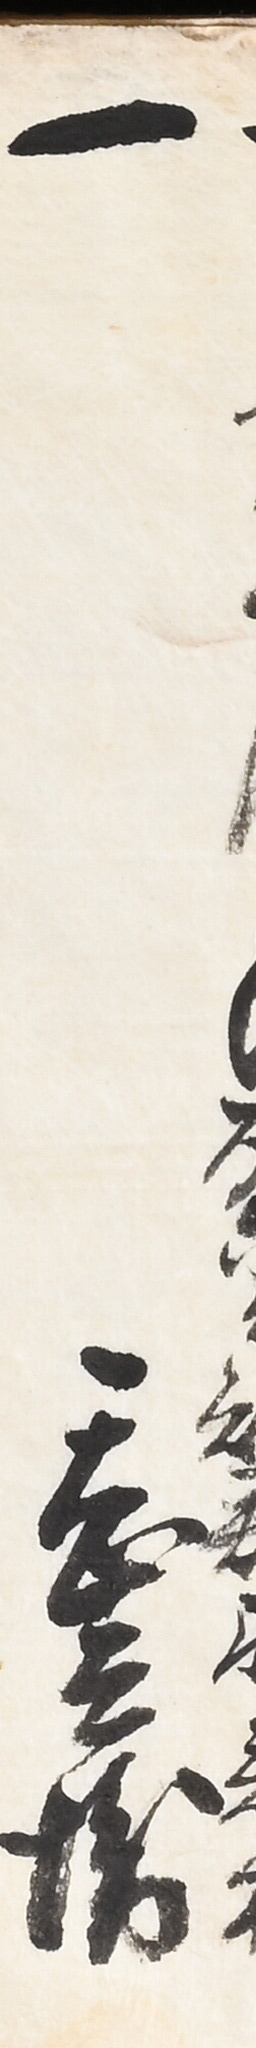一甚兵衛
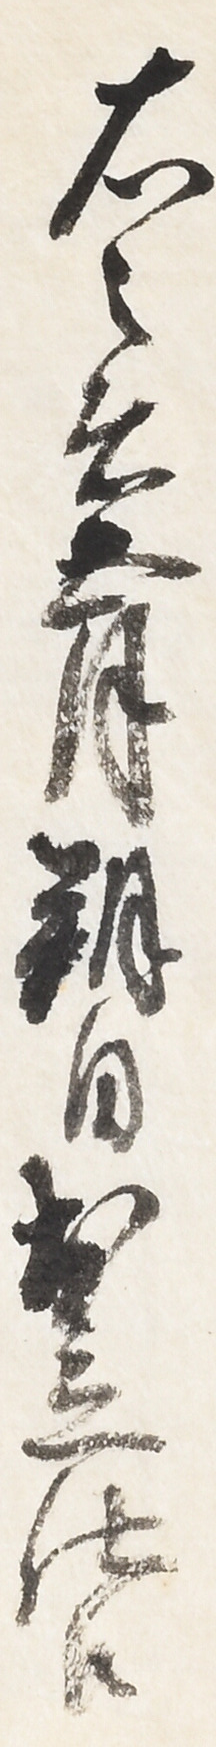右之者五月朔日出立仕候
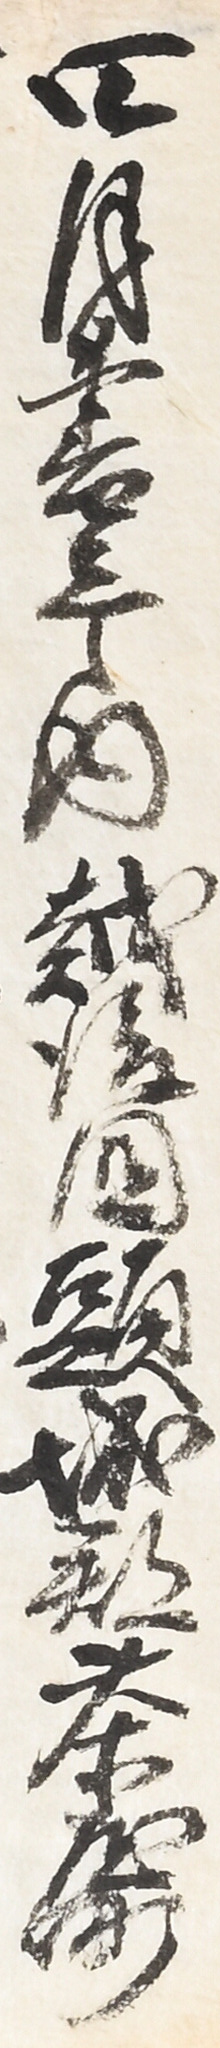四月書上之内越後国頸城郡茶屋町
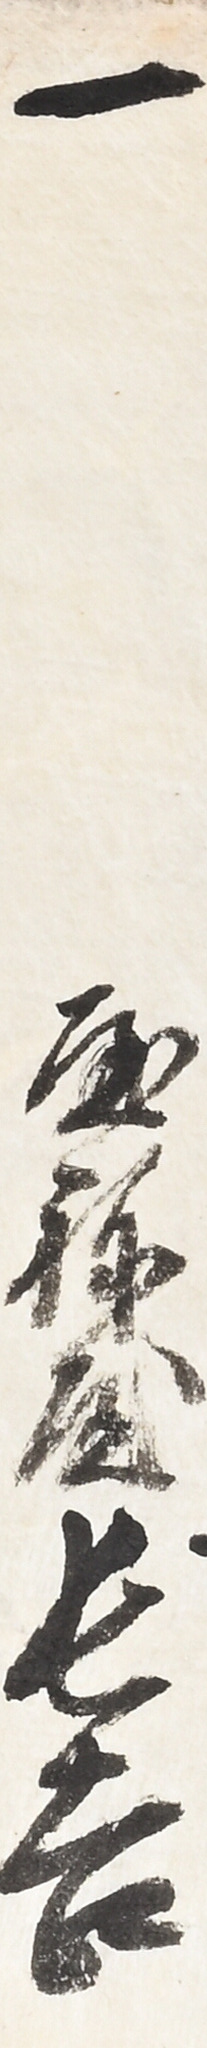一屋祢屋長吉
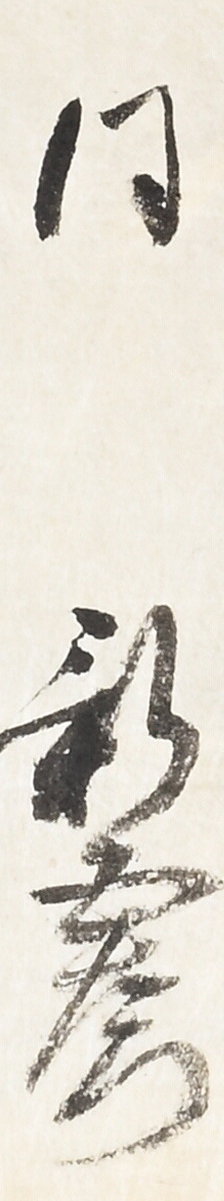同新五右衛門
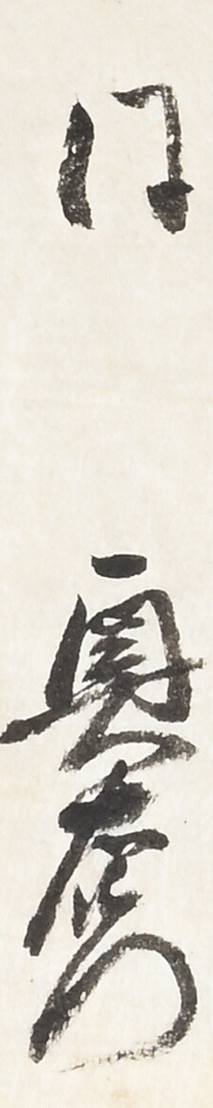同奥右衛門
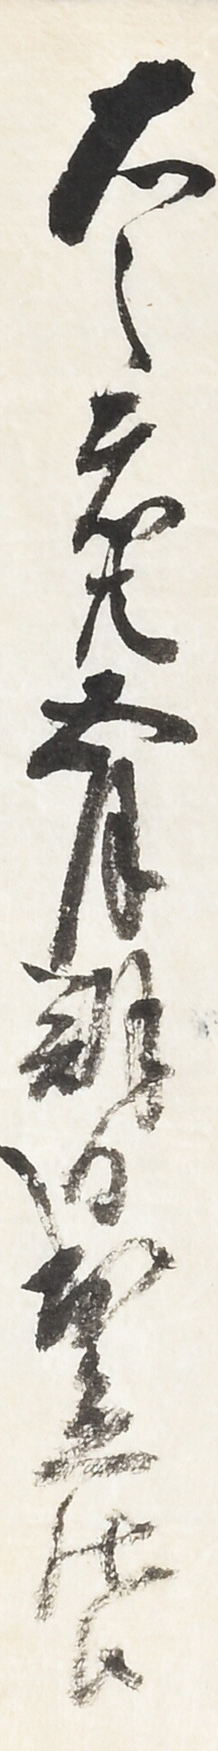右之者共五月朔日出立仕候
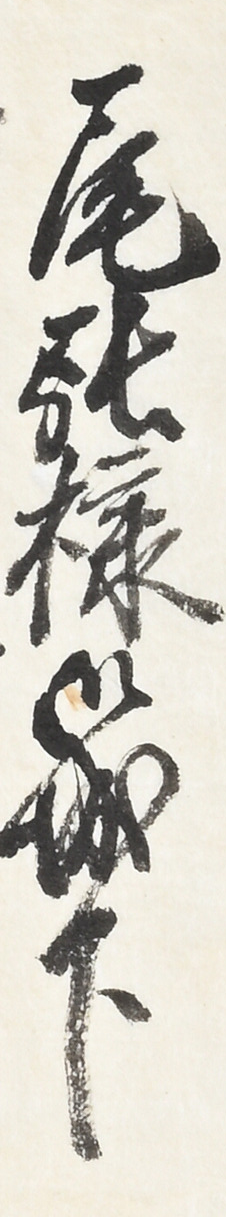尾張様御城下
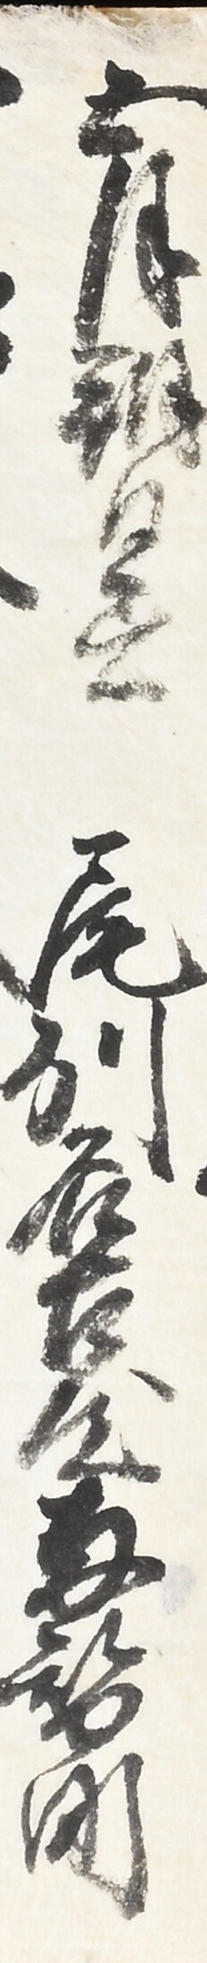五月朔日着尾州名古屋両替町
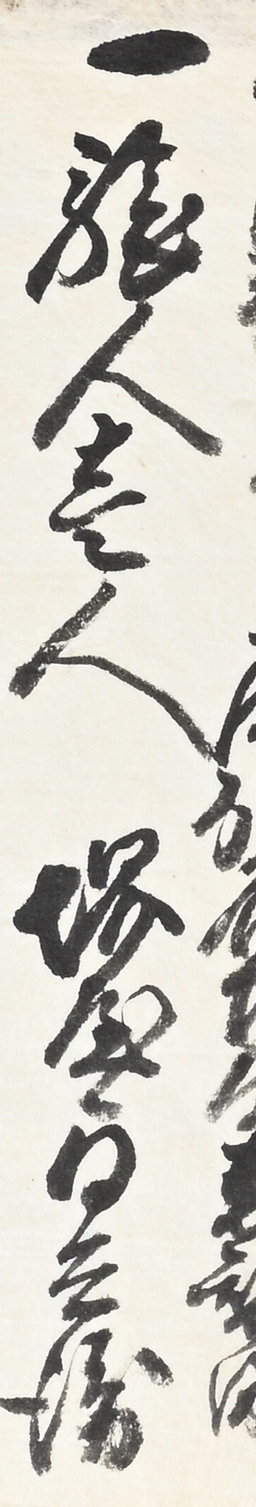一旅人壱人堺屋与兵衛
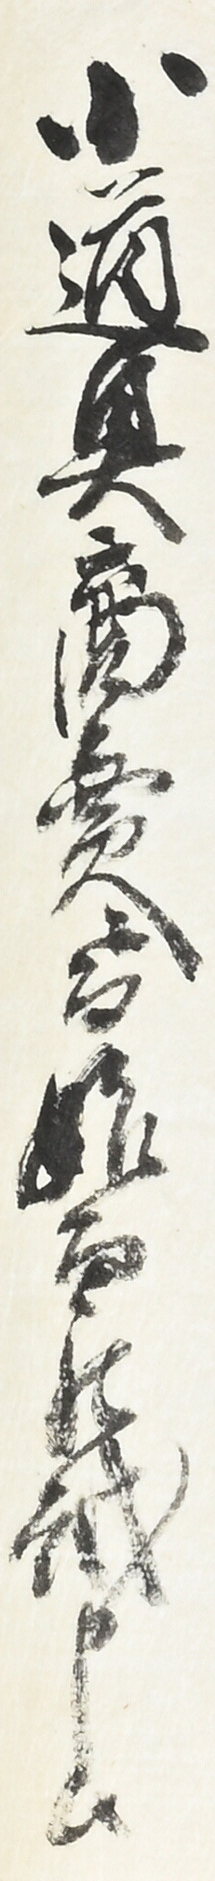小道具商売ニ而始而罷越申候
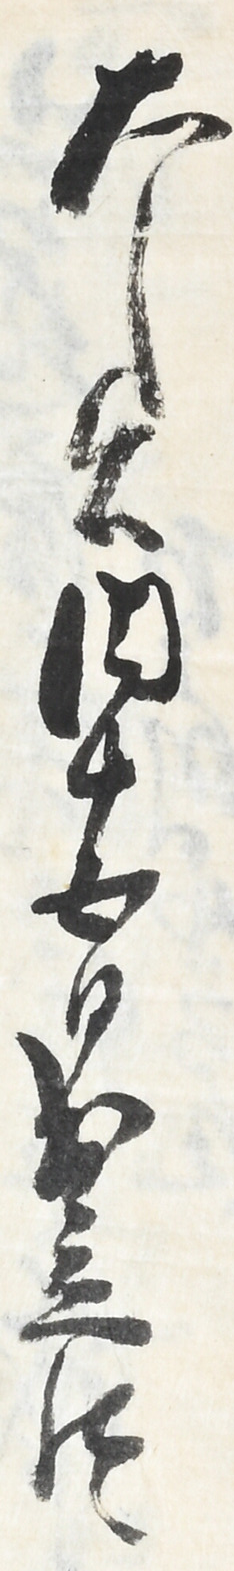右之者五月朔日出立仕候

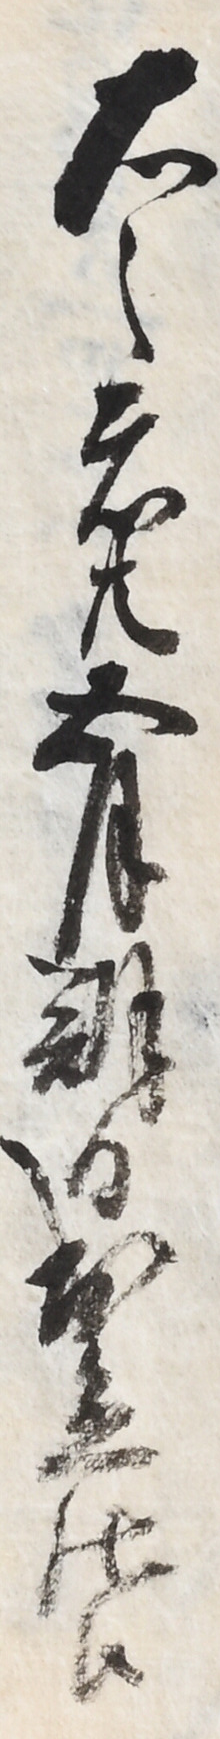右之者五月二日出立仕候
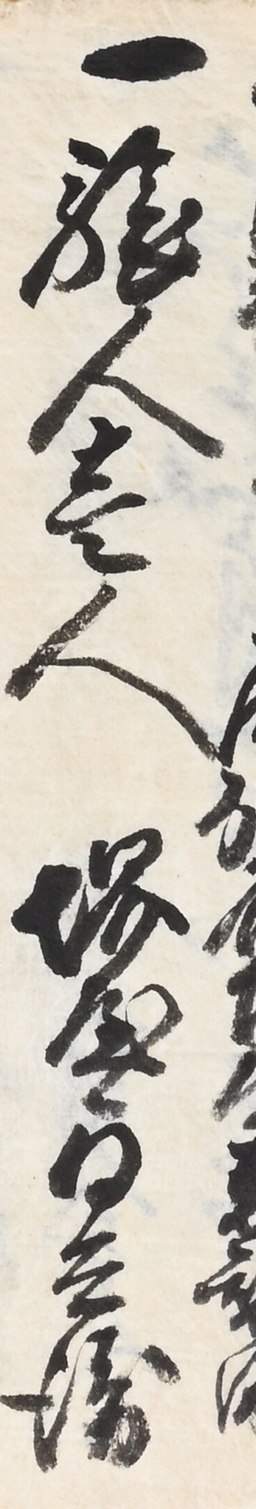一旅人壱人綿屋忠平
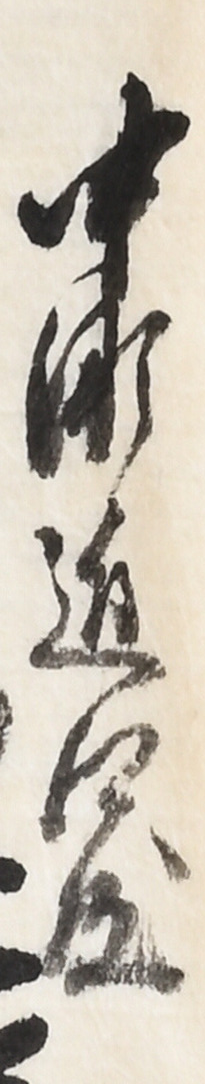中町近江屋
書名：旅人泊控帳
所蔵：伊那市立高遠町図書館・合同会社AMANE
